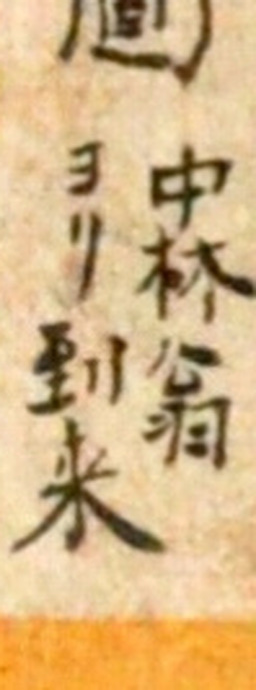ヨリ到来
